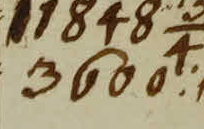3600
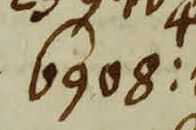6908
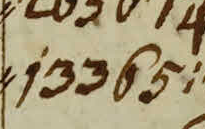13365
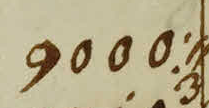9000.
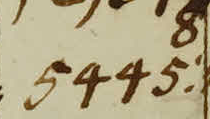5445
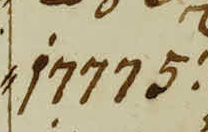17775
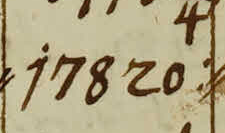17820
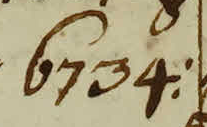6734.
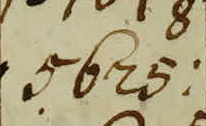5625
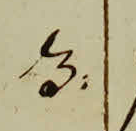3:
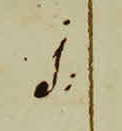1:
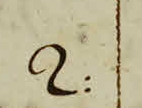2:
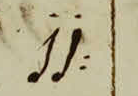11:
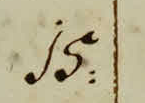15:
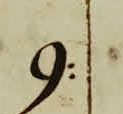9:
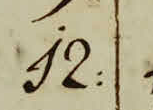12:
